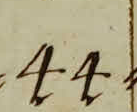44
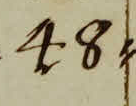48
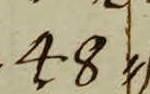48
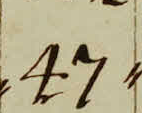47
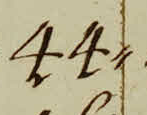44
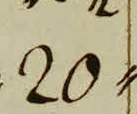20
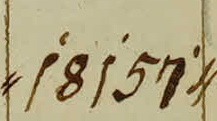18157
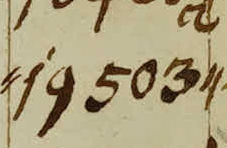19503
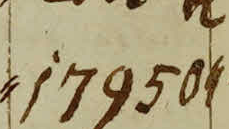17950
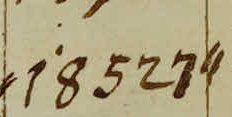18527
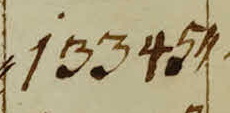13345
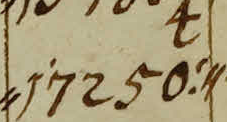17250:
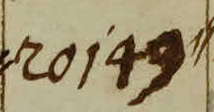20149
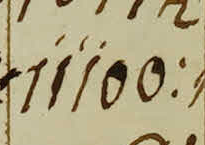11100.
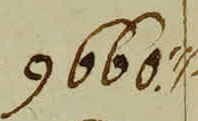9660.
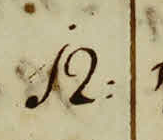12:
